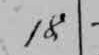18
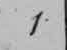1
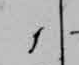1
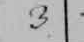3
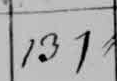131
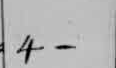4
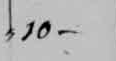10
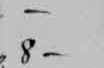8
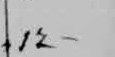12
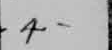4
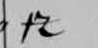12
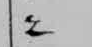2
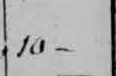10
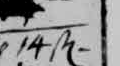143
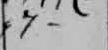7
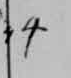4
